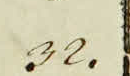32.
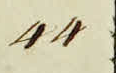44
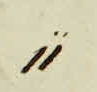11
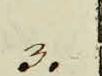3.
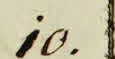10.
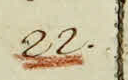22.
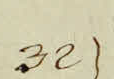32
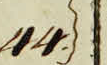44.
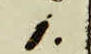1.
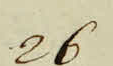26
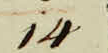14
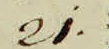21.
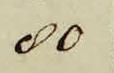80
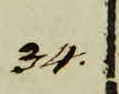34.
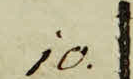10.
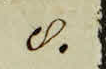8.
